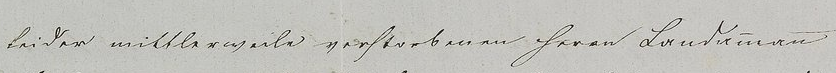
leider mittlerweile verstorbenen Herrn Landamman
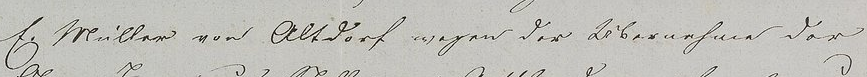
E. Müller von Altdorf wegen der Übernahme der
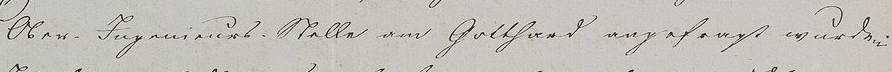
Ober-Ingenieurs-Stelle am Gotthard angefragt wurden.
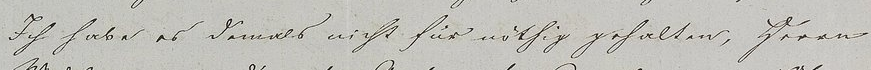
Ich habe es damals nicht für nöthig gehalten, Herrn
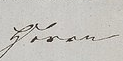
Herrn
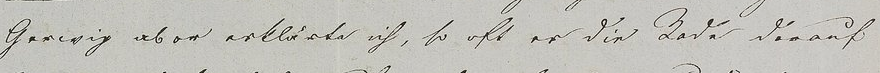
Gerwig aber erklärte ich, so oft er die Rede darauf
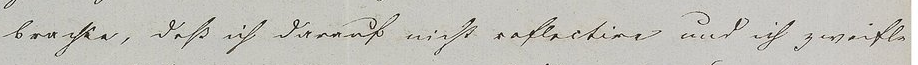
brachte, daß ich darauf nicht reflectire und ich zweifle
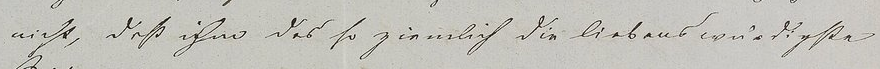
nicht, daß ihm das so ziemlich die liebenswürdigste
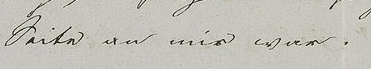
Seite an mir war.
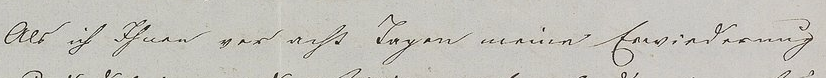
Als ich Ihnen vor acht Tagen meine Erwiederung
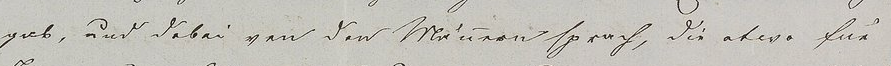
gab, und dabei von den Männern sprach, die etwa für
